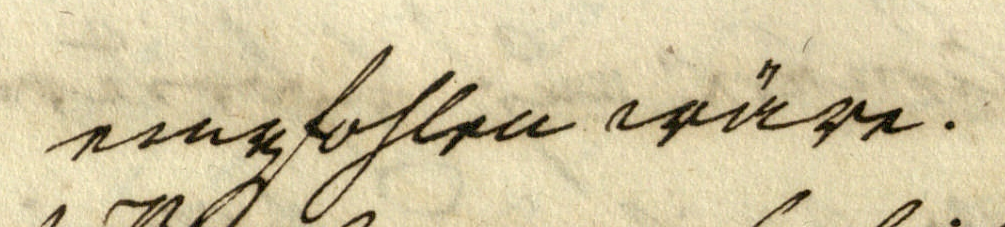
empfohlen wäre.
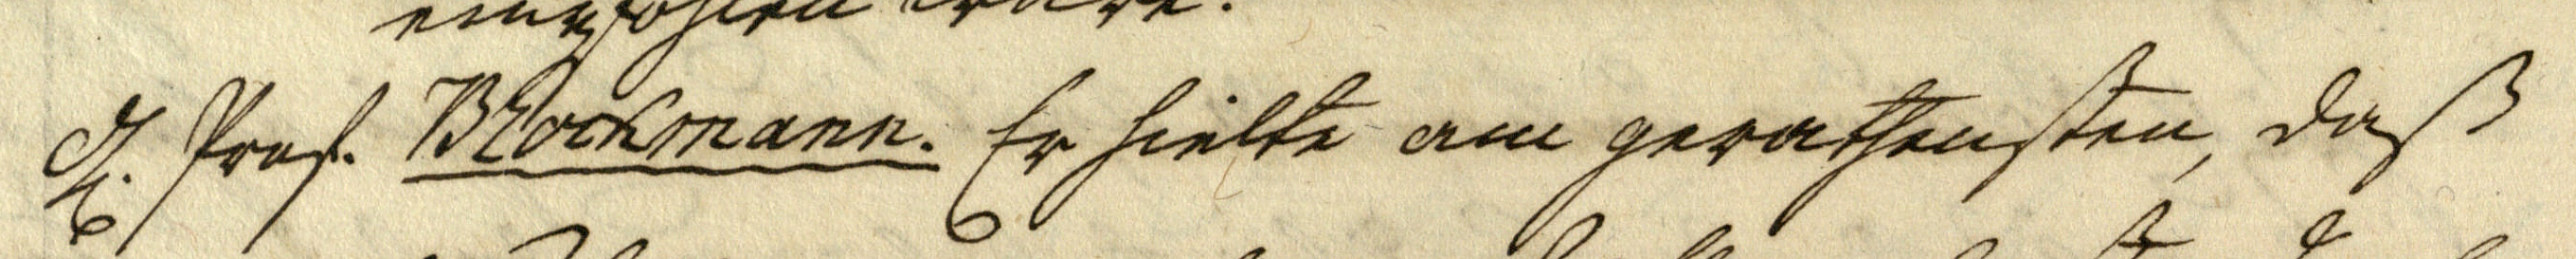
dh. Prof. Brockmann. Er hielte am gerathensten, daß
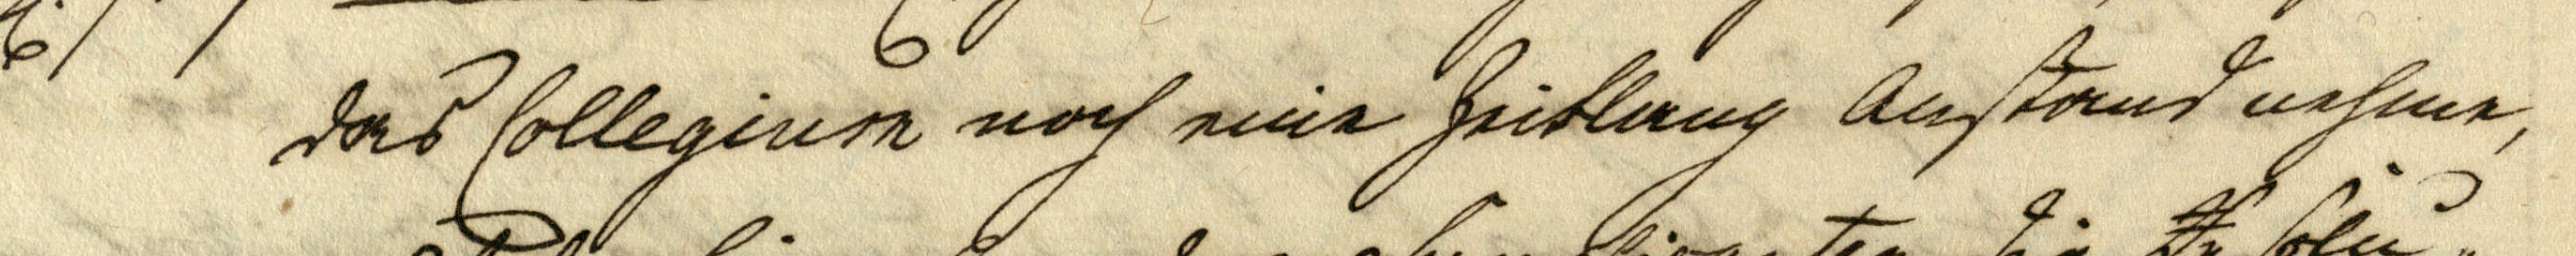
das Collegium noch eine Zeitlang Anstand nehme,
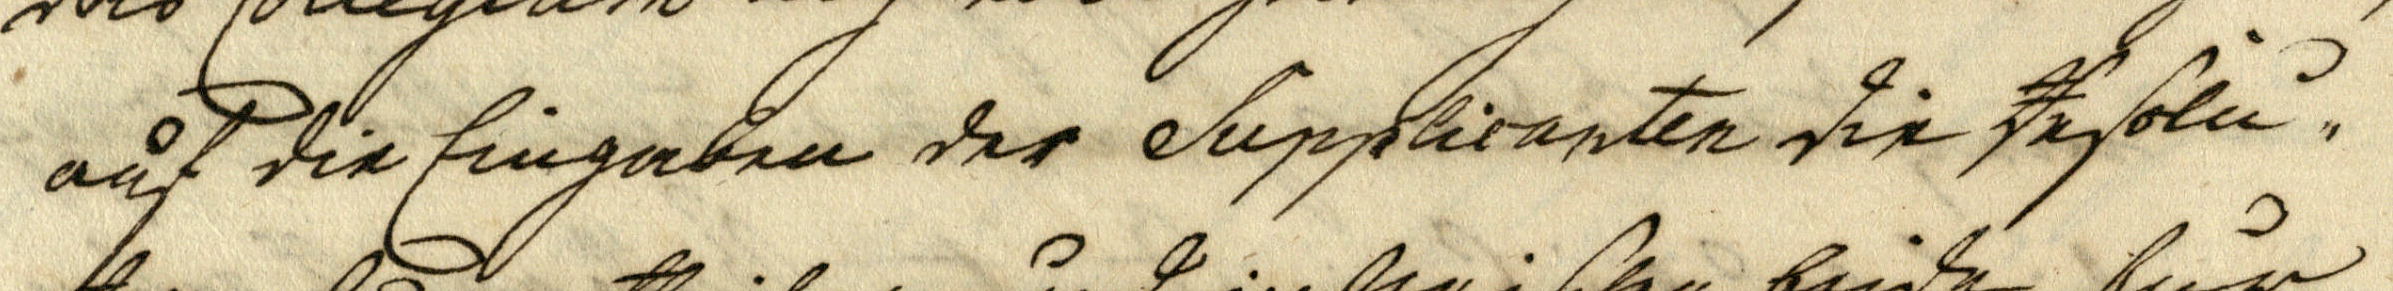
auf die Eingaben der Supplicanten die Resolu-
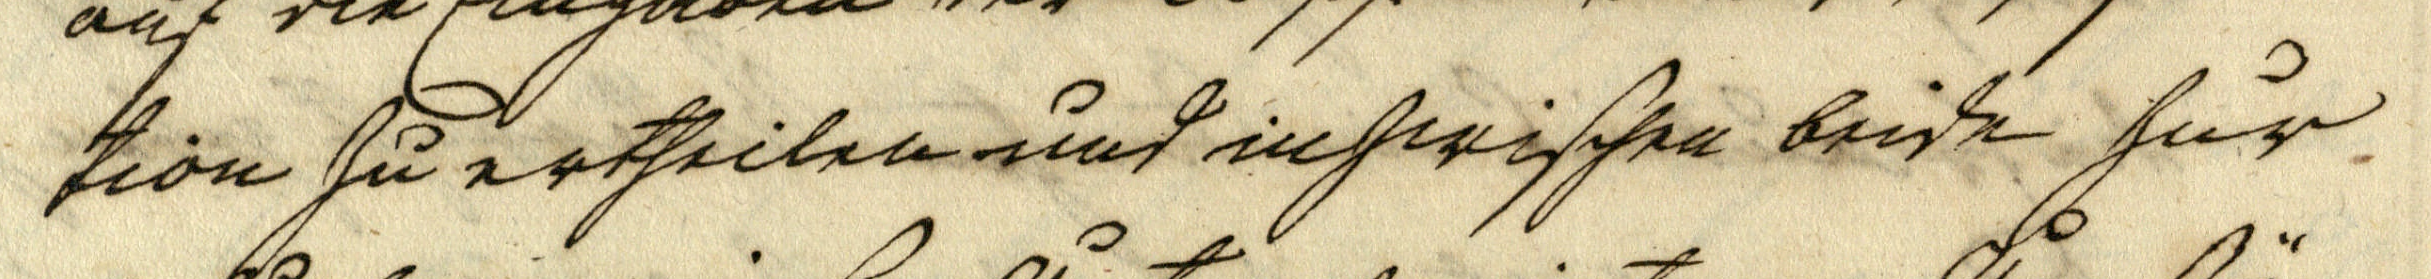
tion zu ertheilen und inzwischen beide zur
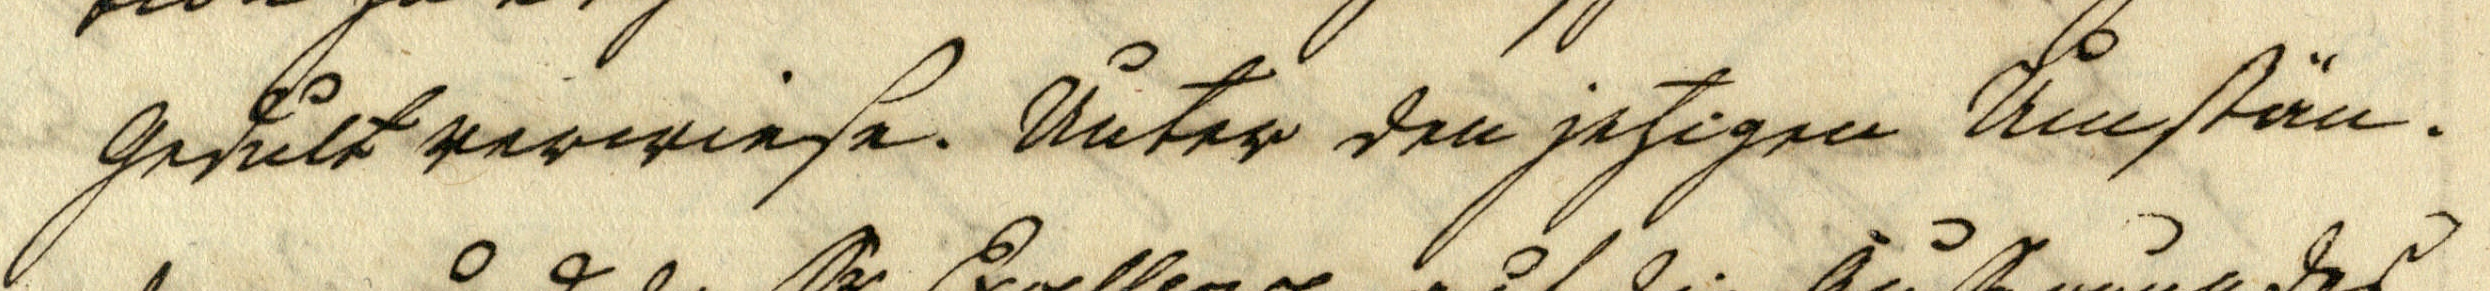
Gedult verwiese. Unter den jetzigen Umstän-
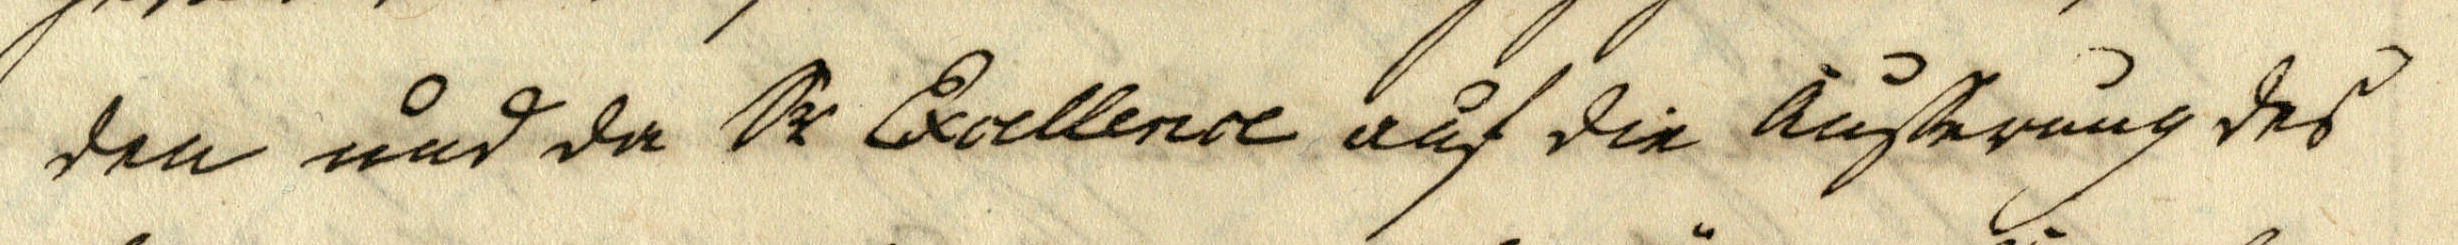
den und da Sr. Excellence auf die Äusserung des
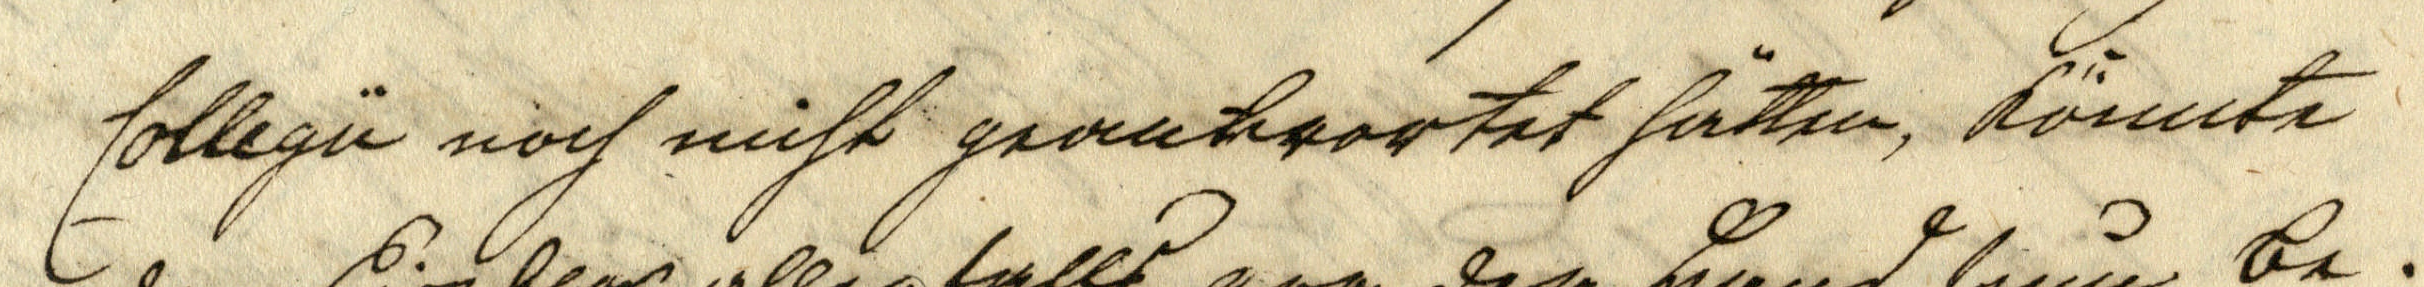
Collegii noch nicht geantwortet hätten, könnte
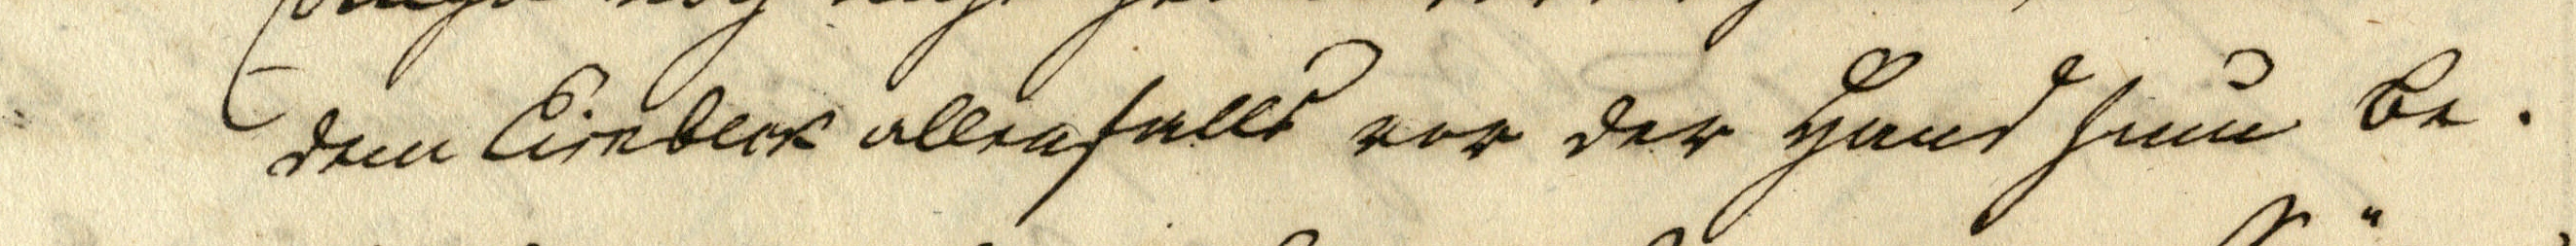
dem Eimbeck allenfalls vor der Hand zum Be-
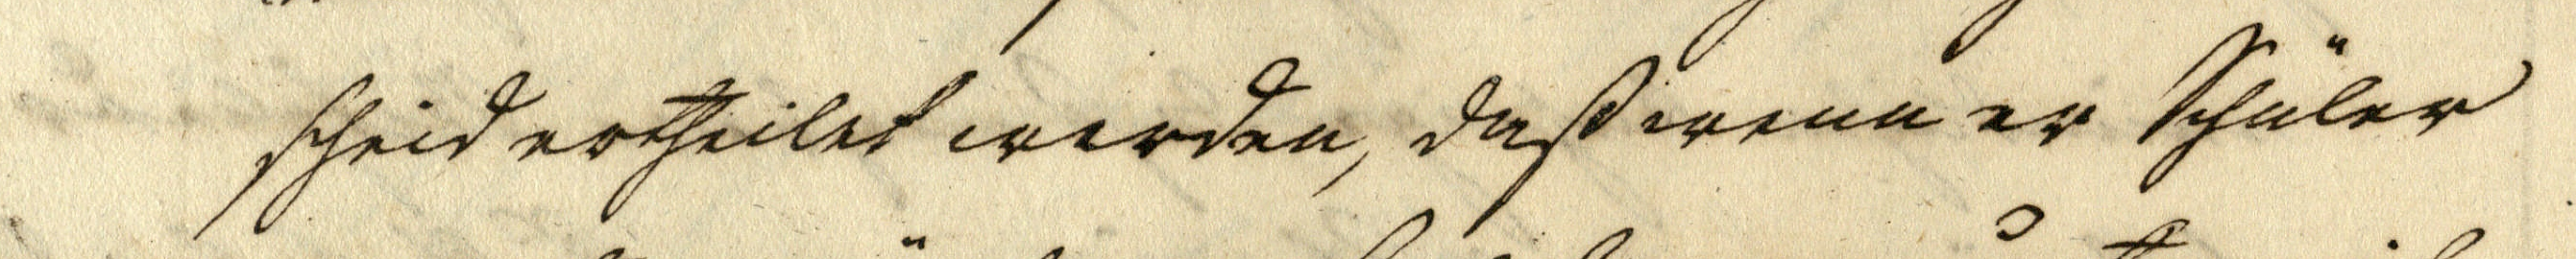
scheid ertheilet werden, daß wenn er Schüler
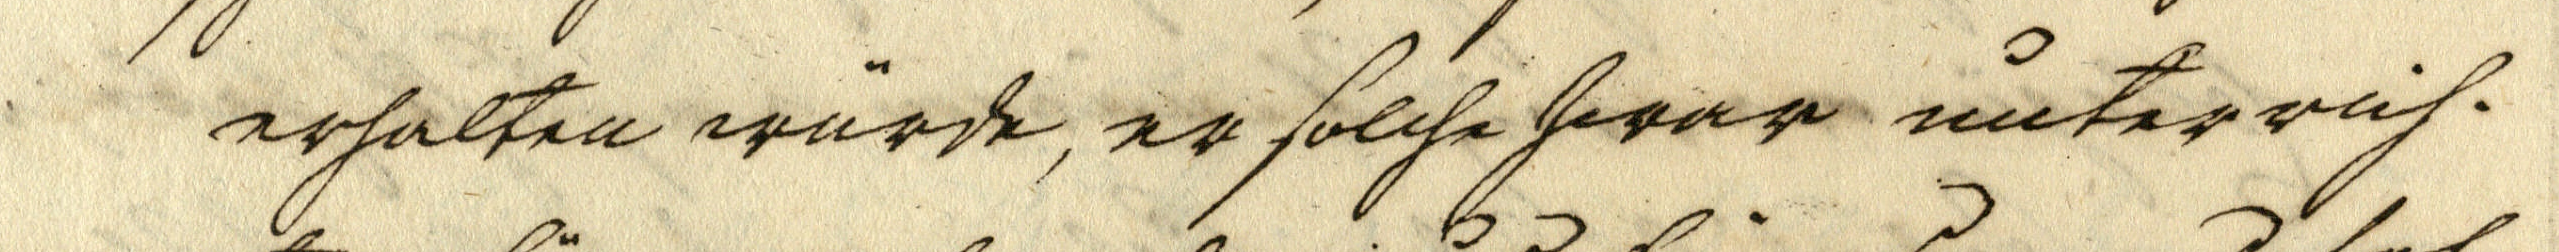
erhalten würde, er solche zwar unterrich-
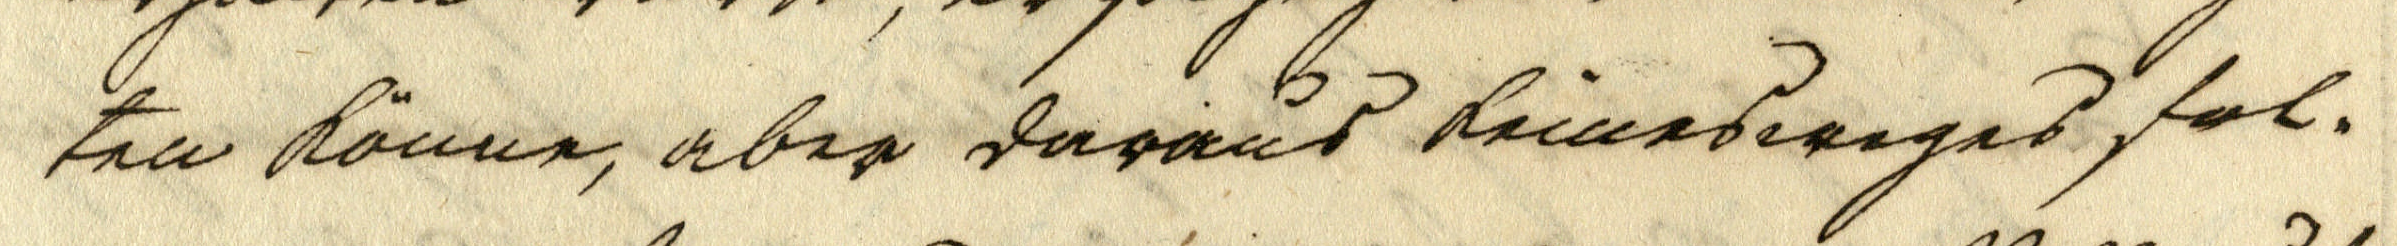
ten könne, aber daraus keinesweges fol-
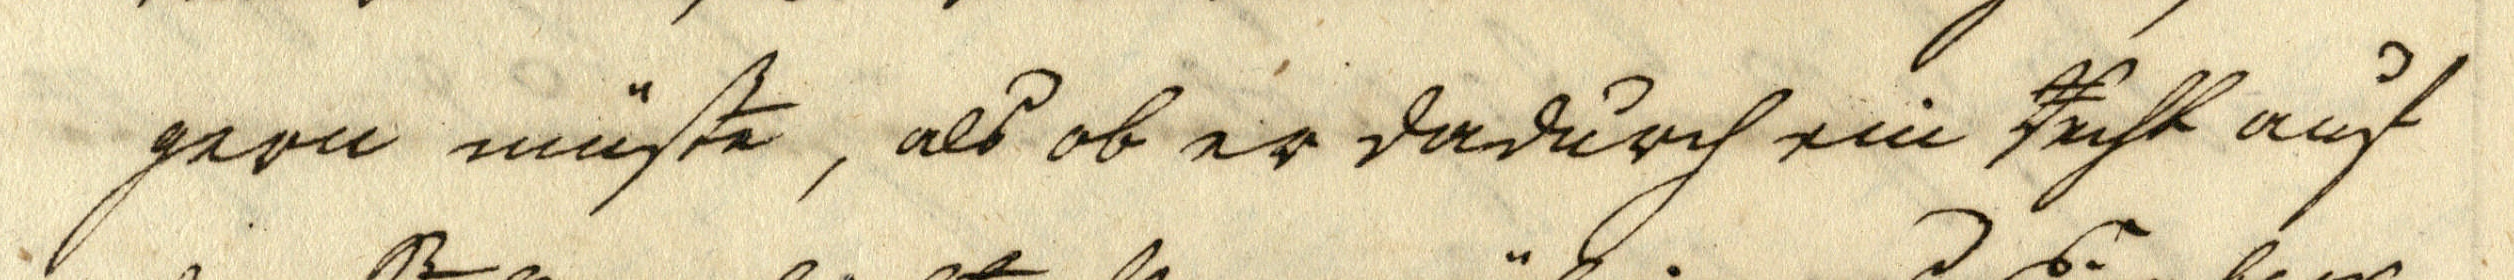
gern müßte, als ob er dadurch ein Recht auf
